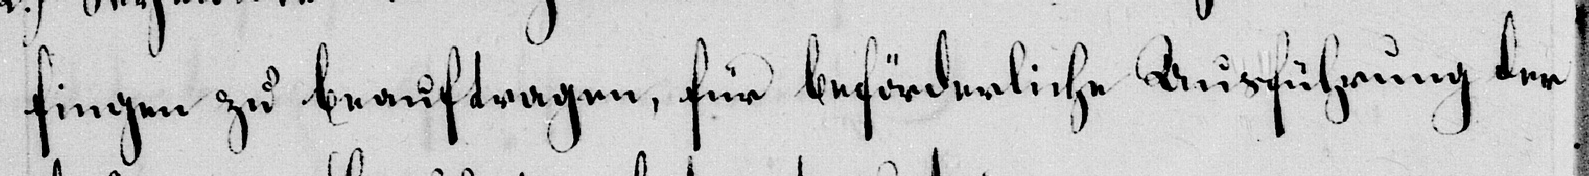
fingen zu beauftragen, für beförderliche Ausführung der
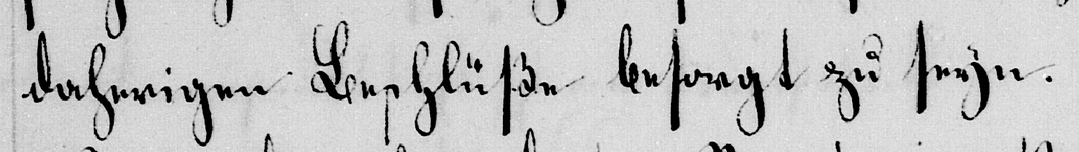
daherigen Beschlüße besorgt zu seyn.
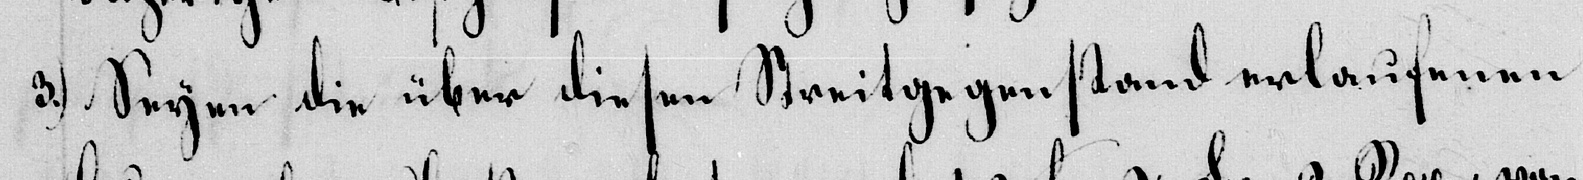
3.) Seyen die über diesen Streitgegenstand erlaufenen
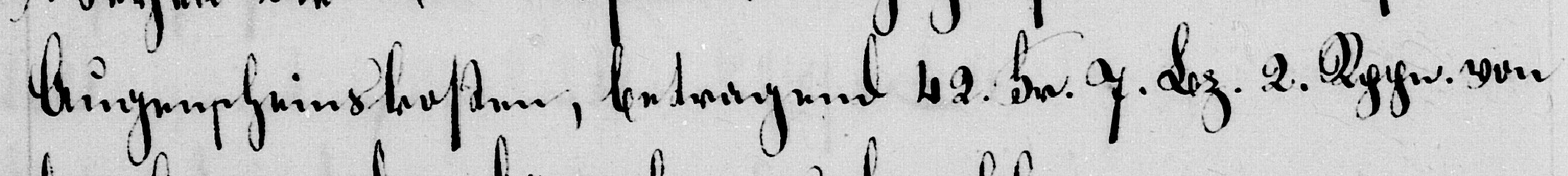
Augenscheinskosten, betragend 42. Fr. 7. Bz. 2. Rppn. von
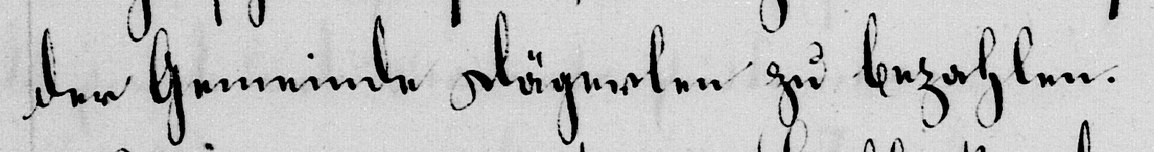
der Gemeinde Dägerlen zu bezahlen.
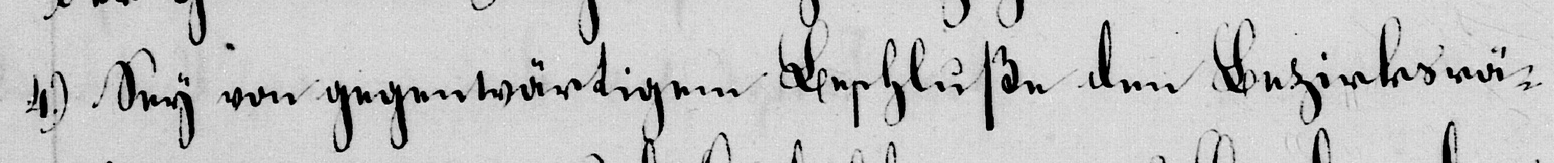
4.) Sey von gegenwärtigem Beschluße den Bezirksrä¬
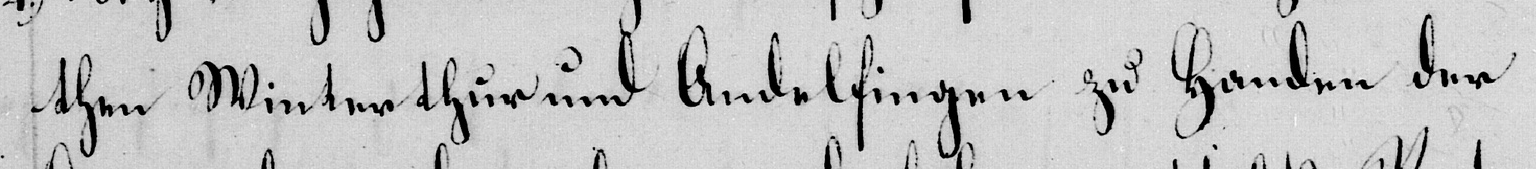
then Winterthur und Andelfingen zu Handen der
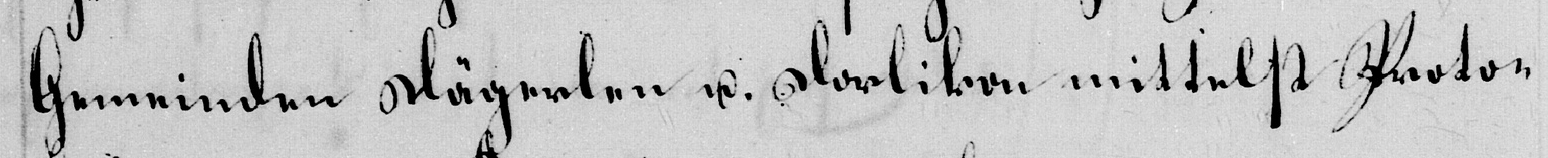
Gemeinden Dägerlen u. Derlikon mittelst Proto¬
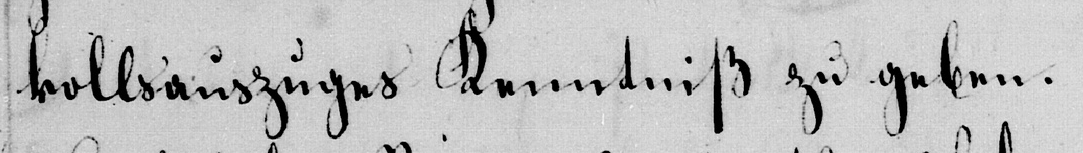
kollsauszuges Kenntniß zu geben.
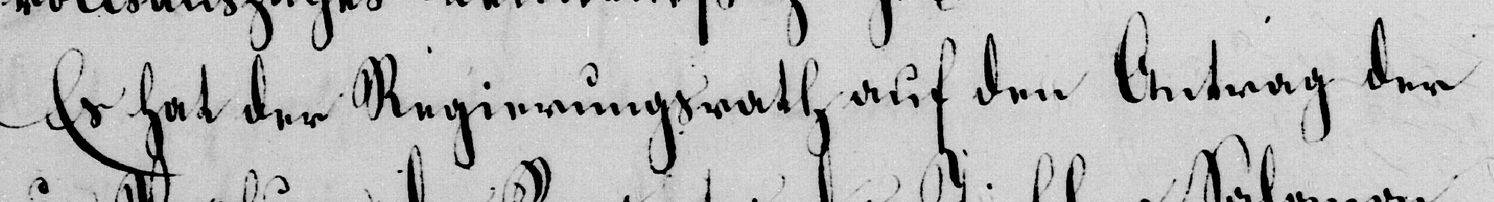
Es hat der Regierungsrath, auf den Antrag der
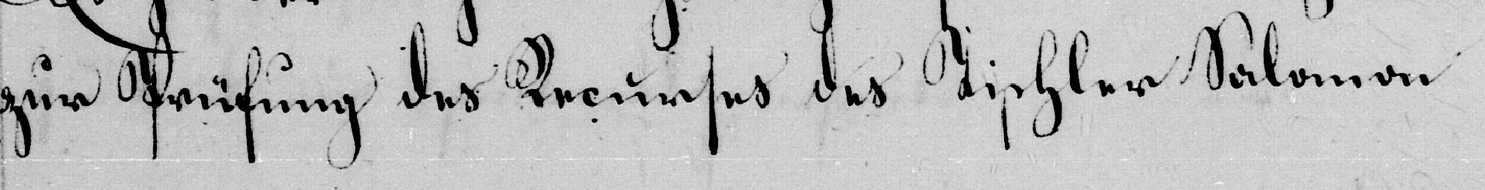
zur Prüfung des Recurses des Tischler Salomon
